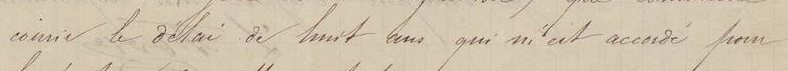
courir le délai de huit ans qui m'est accordé pour
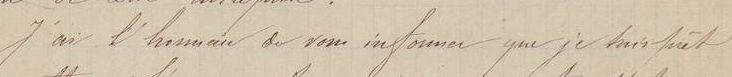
J'ai l'honneur de vous informer que je suis prêt
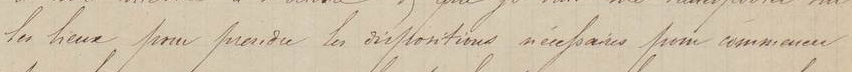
les lieux pour prendre les dispositions nécessaires pour commencer
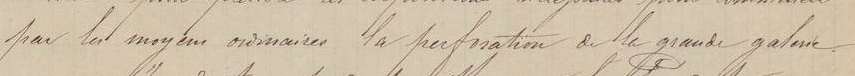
par les moyens ordinaires la perforation de la grande galerie.
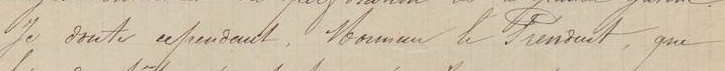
Je doute cependant, Monsieur le Président, que
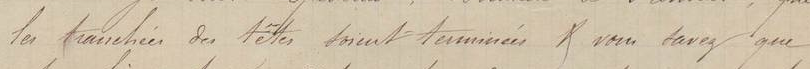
les tranchées des têtes soient terminées & vous savez que
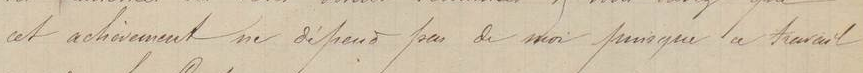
cet achèvement ne dépend pas de moi puisque ce travail
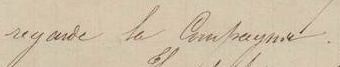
regarde la Compagnie.
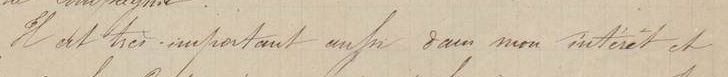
Il est très important aussi dans mon intérêt et
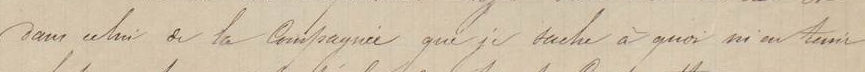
dans celui de la Compagnie que je sache à quoi m'en tenir
